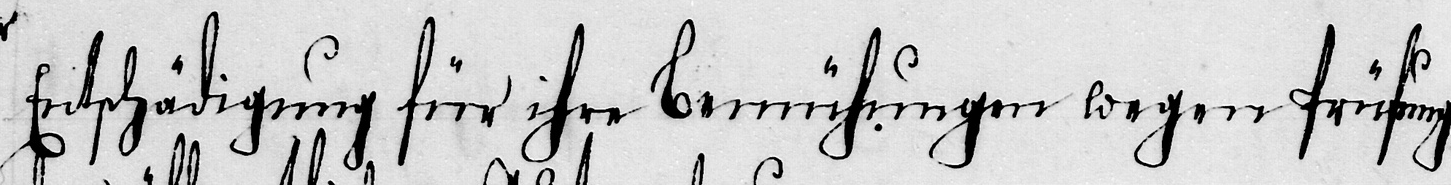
Entschädigung für ihre Bemühungen wegen Prüfung
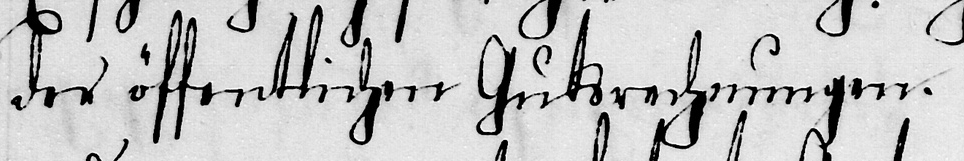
der öffentlichen Gutsrechnungen.
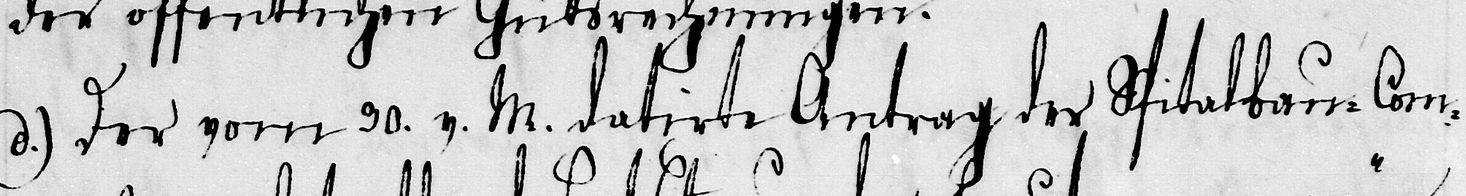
d.) Der vom 30. v. M. datirte Antrag der Spitalbau-Com¬
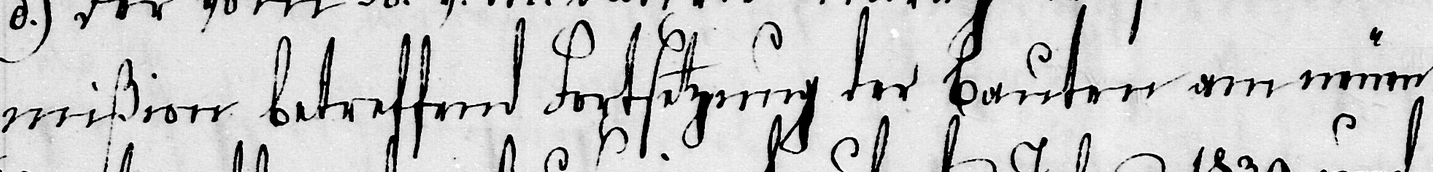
mißion betreffend Fortsetzung der Bauten am neuen
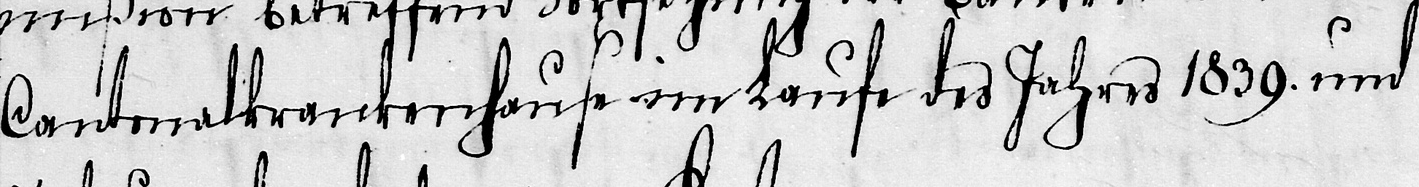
Cantonalkrankenhause im Laufe des Jahres 1839. und
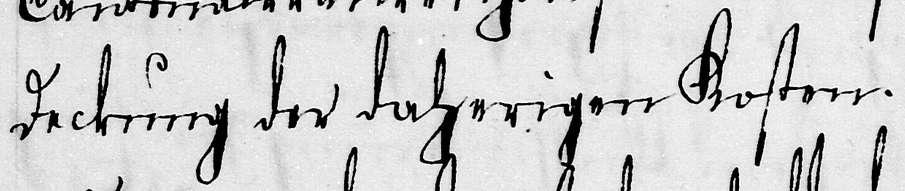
Deckung der daherigen Kosten.
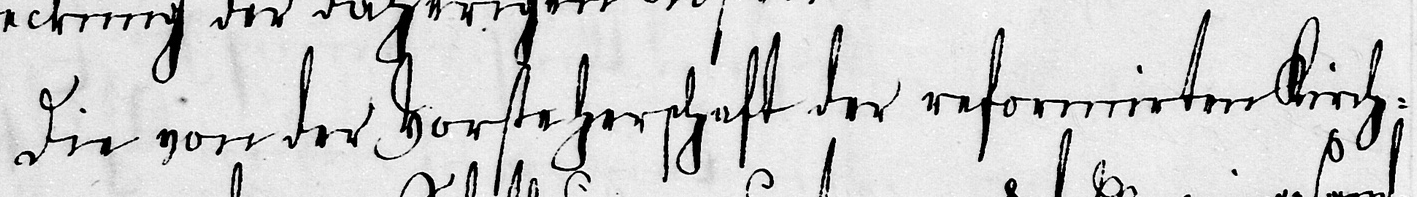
Die von der Vorsteherschaft der reformirten Kirch¬
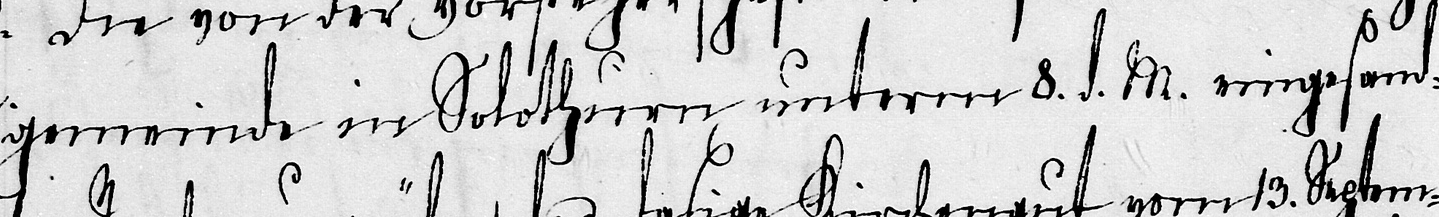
gemeinde in Solothurn unterm 8. d. M. eingesand¬
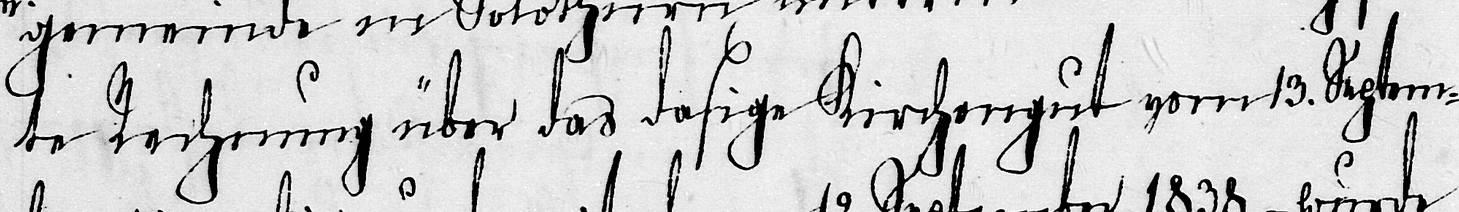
te Rechnung über das dasige Kirchengut vom 13. Septem¬
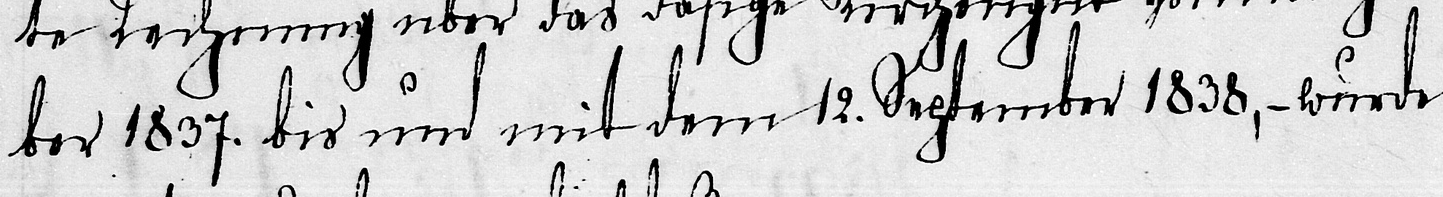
ber 1837. bis und mit dem 12. September 1838, – wurde
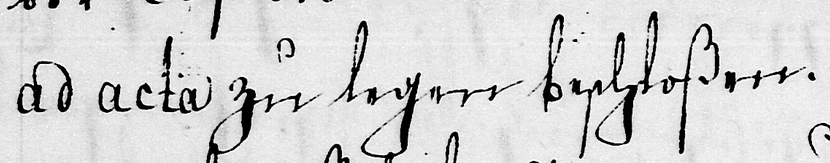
ad acta zu legen beschloßen.
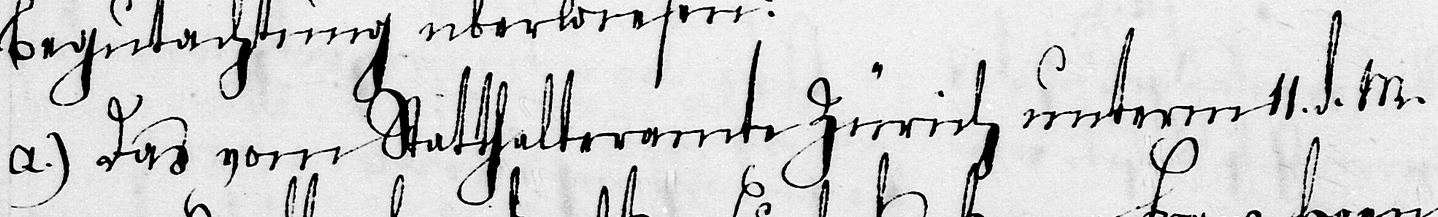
a.) Das vom Statthalteramte Zürich unterm 11. d. M.
